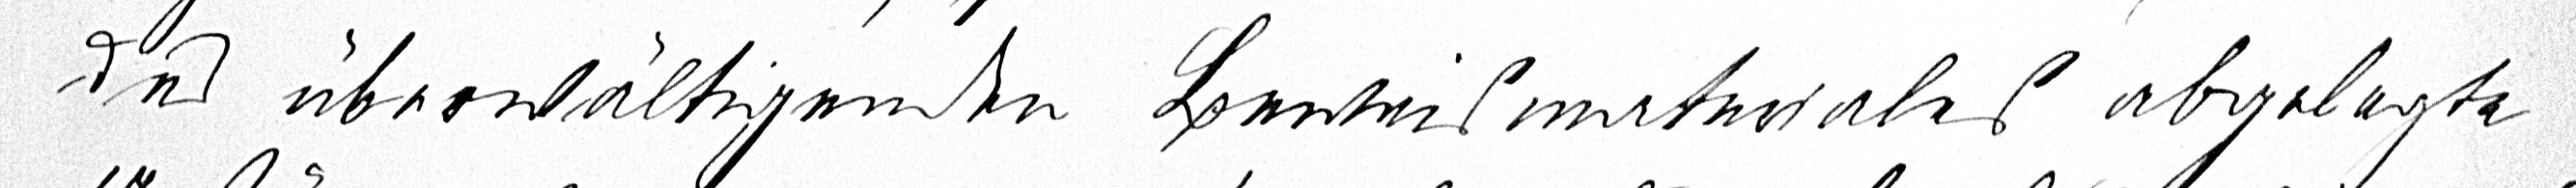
des überwältigenden Beweismateriales abgelegte
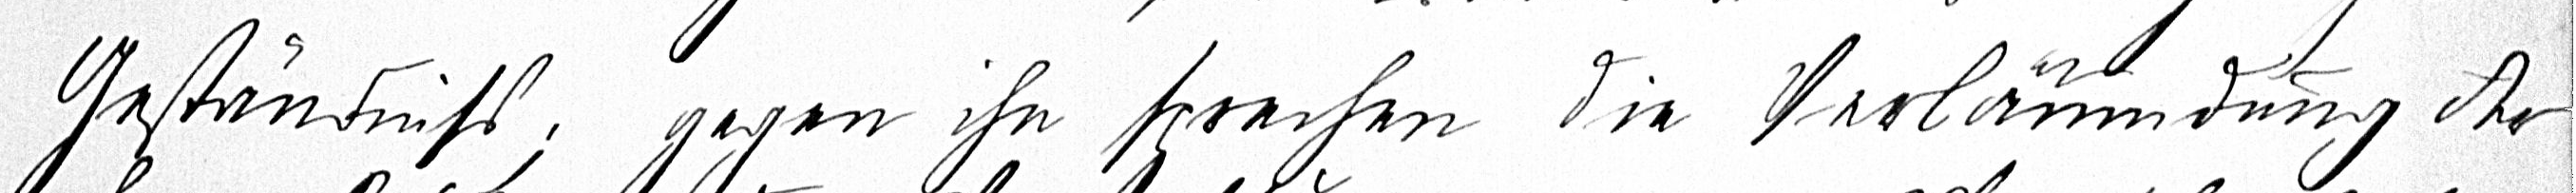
Geständniss, gegen ihn sprechen die Verläumdung der
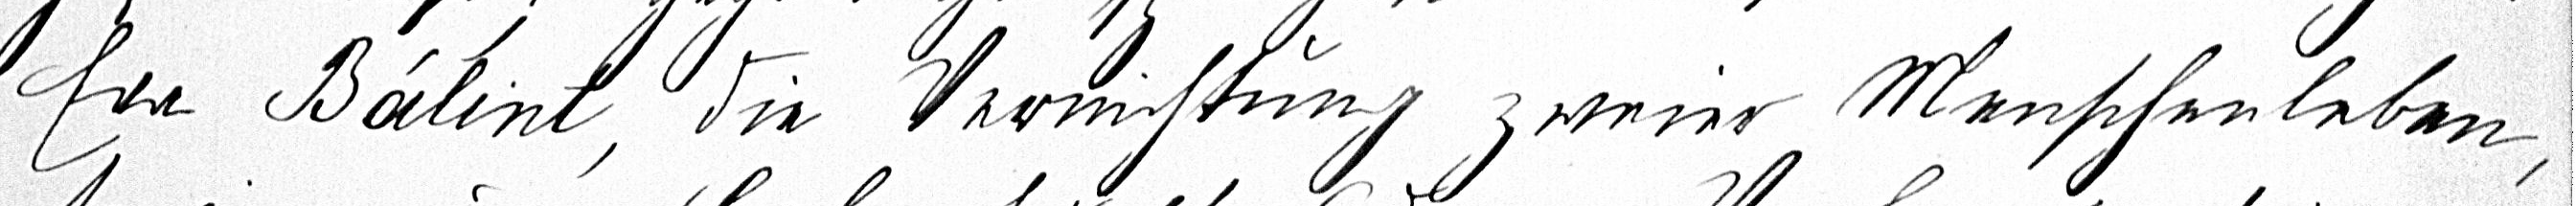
Eva Bálint, die Vernichtung zweier Menschenleben,
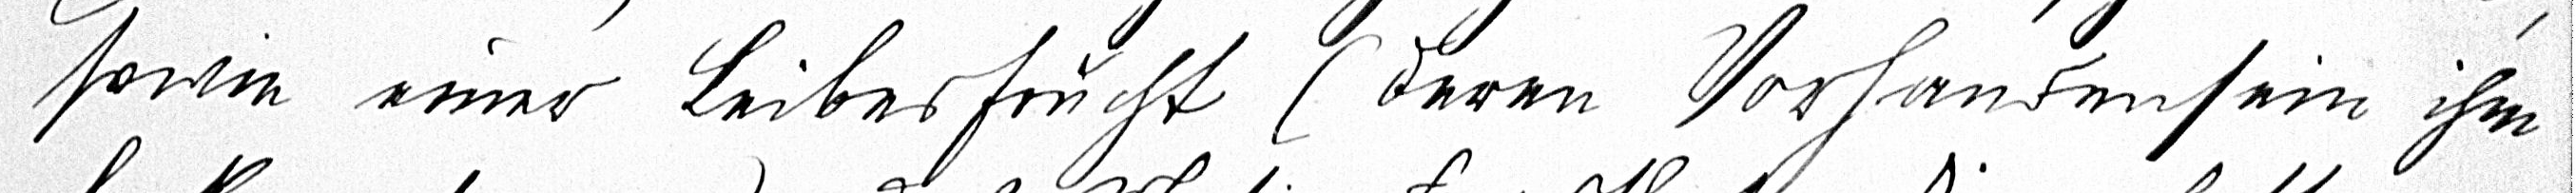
sowie einer Leibesfrucht (deren Vorhandensein ihm
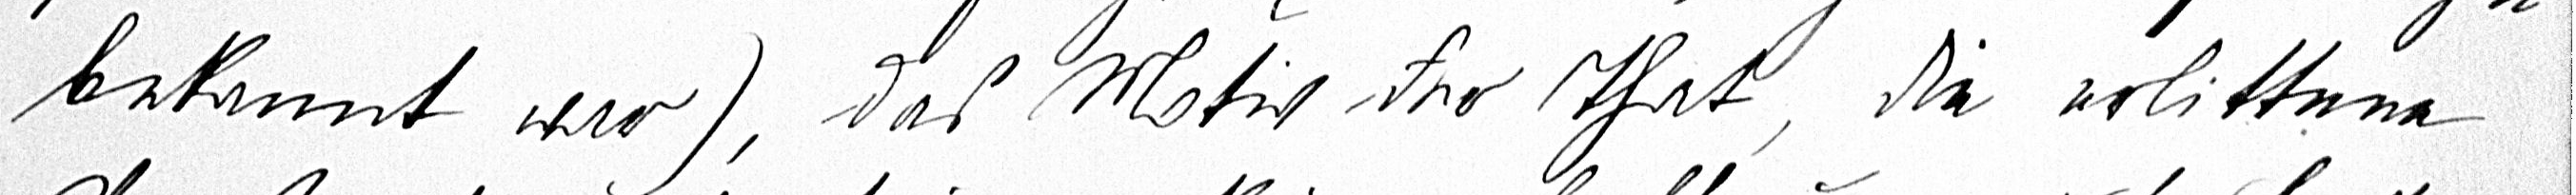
bekannt war), das Motiv der That, die erlittene
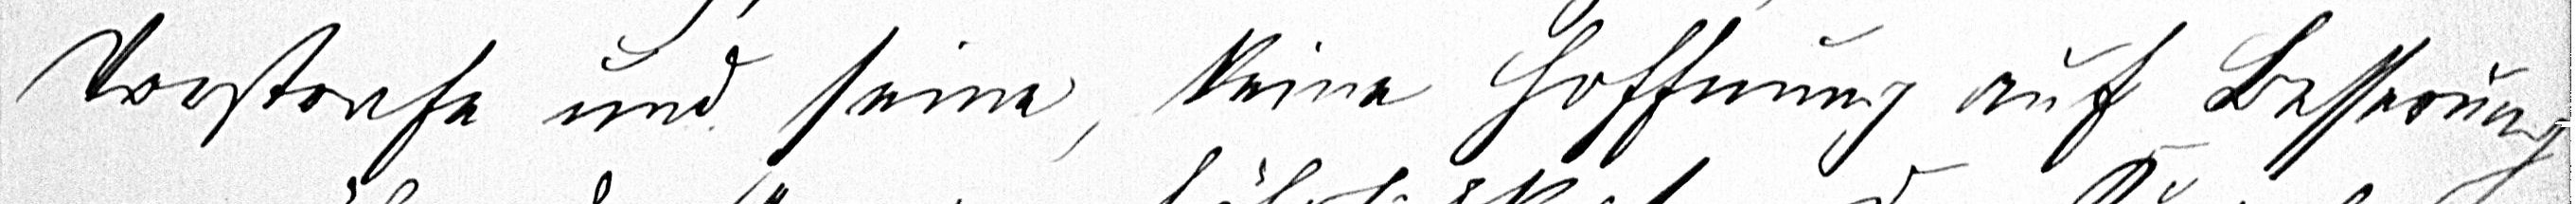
Vorstrafe und seine, keine Hoffnung auf Besserung
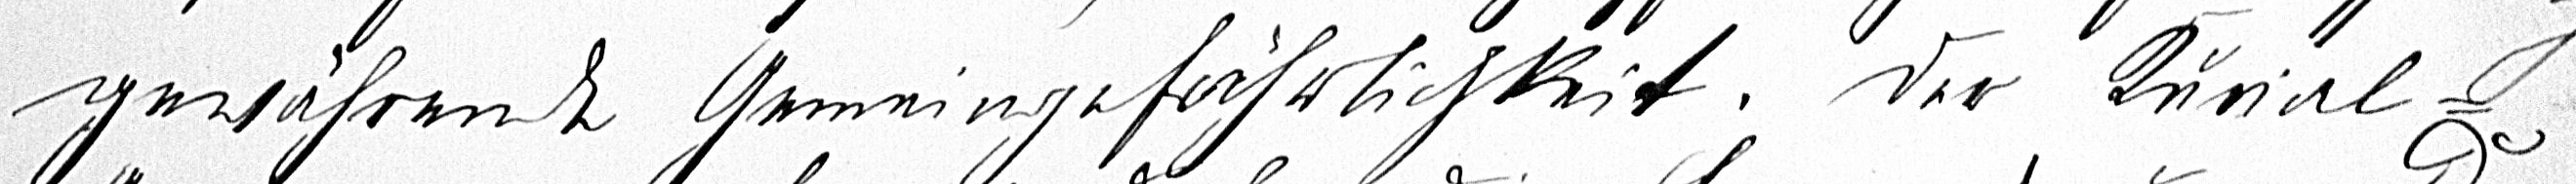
gewährende Gemeingefährlichkeit. Der Kurial ¬
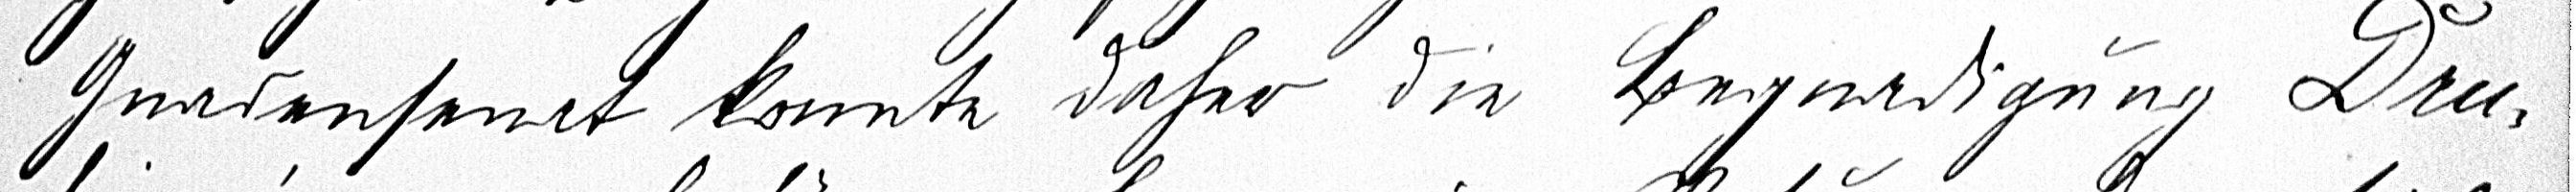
Gnadensenat konnte daher die Begnadigung Dru¬
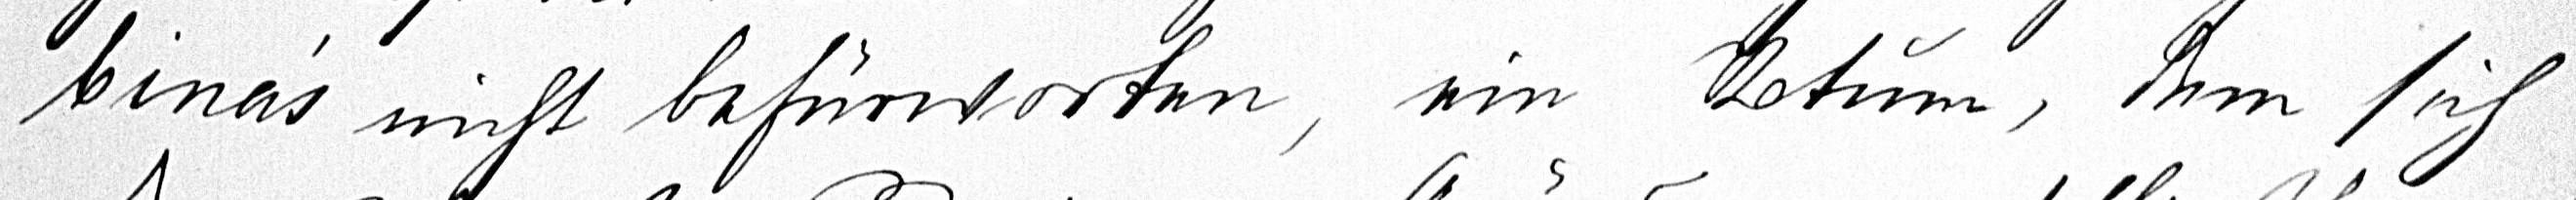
binás nicht befürworten, ein Votum, dem sich
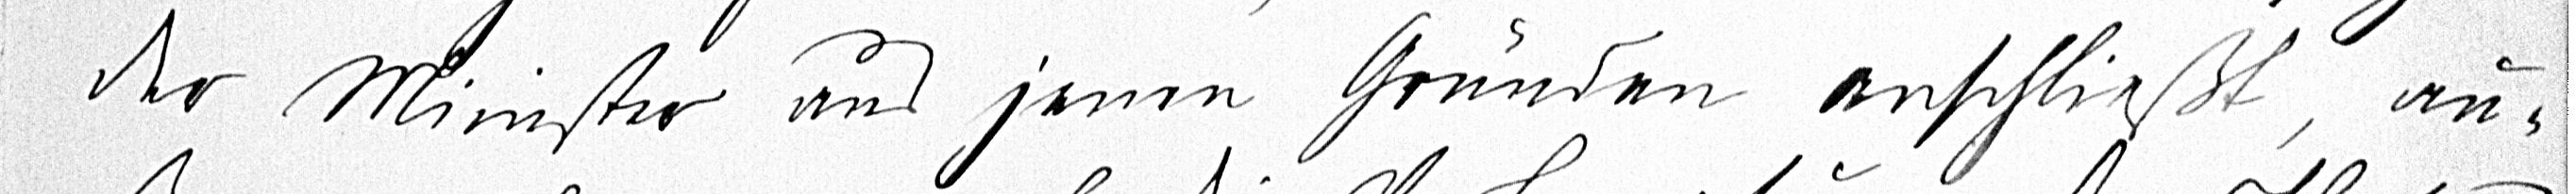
der Minister aus jenen Gründen anschließt, au¬
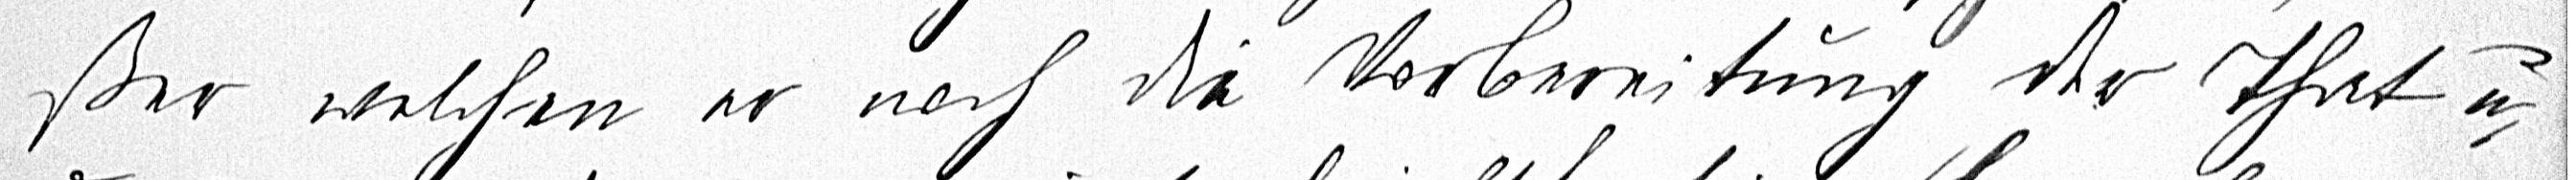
ßer welchen er noch die Vorbereitung der That u,
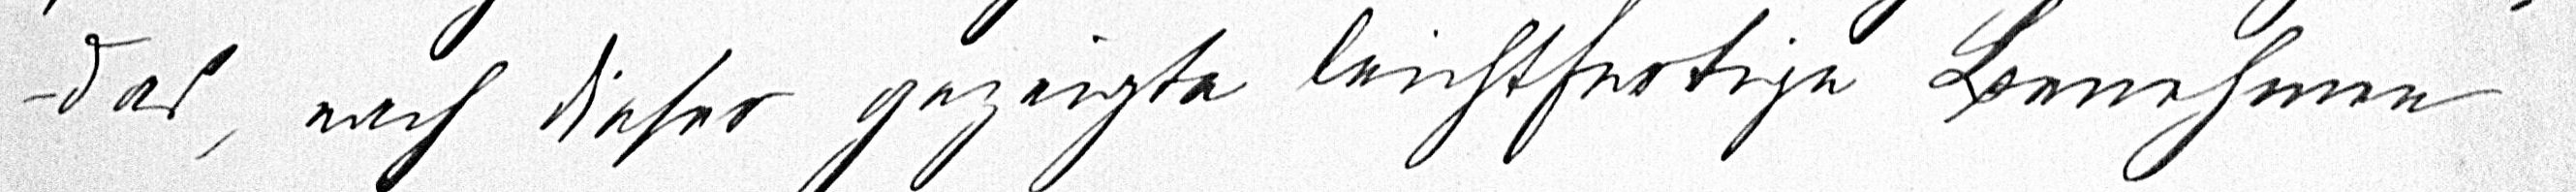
das nach dieser gezeigte leichtfertige Benehmen
